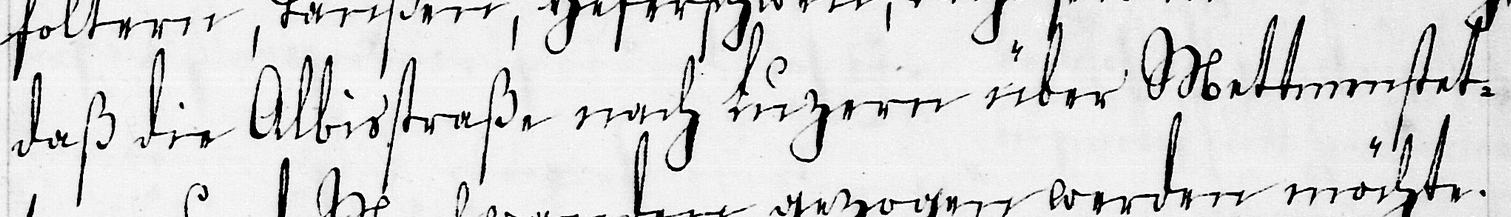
daß die Albisstraße nach Luzern über Mettmenstet¬
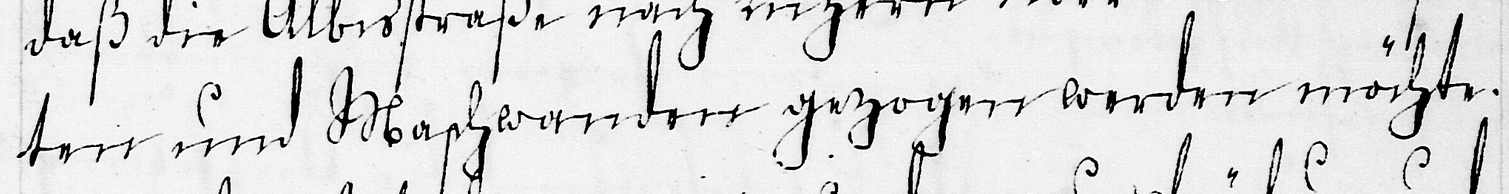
ten und Maschwanden gezogen werden möchte.
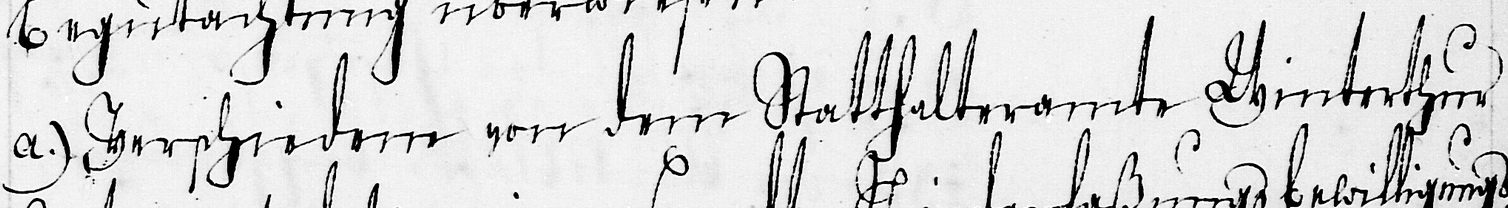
a.) Verschiedene von dem Statthalteramte Winterthur
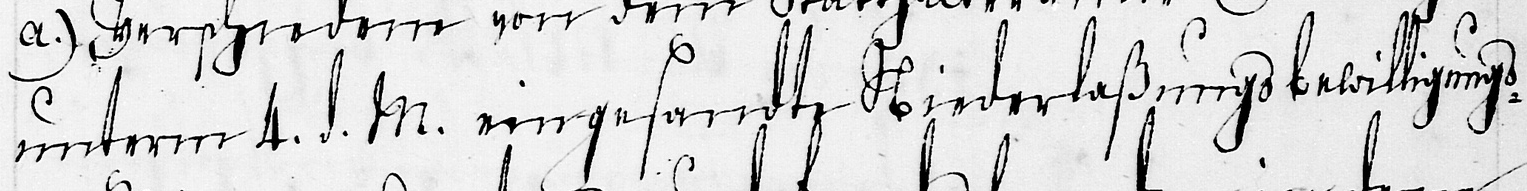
unterm 4. d. M. eingesandte Niederlaßungsbewilligung¬
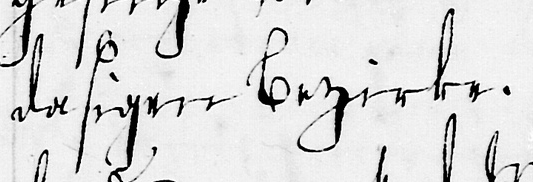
dasigen Bezirke.
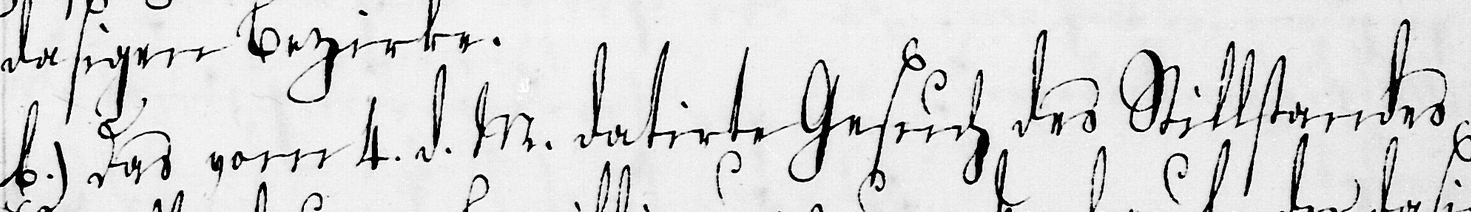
b.) Das vom 4. d. M. datirte Gesuch des Stillstandes
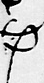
zu
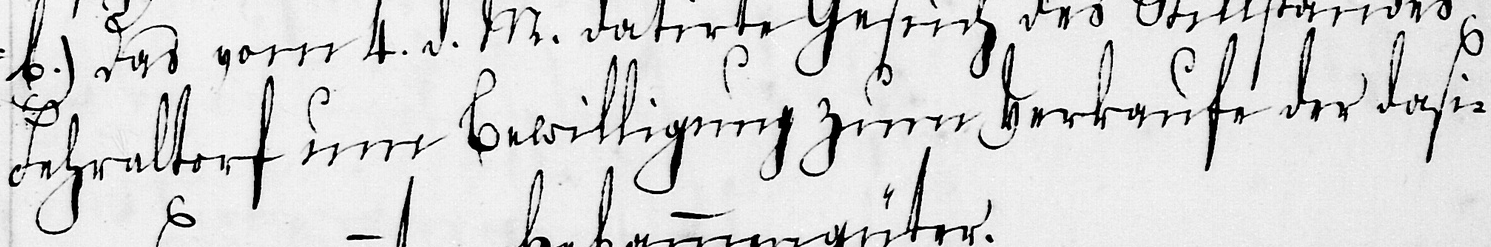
Fehraltorf um Bewilligung zum Verkaufe der dasi¬
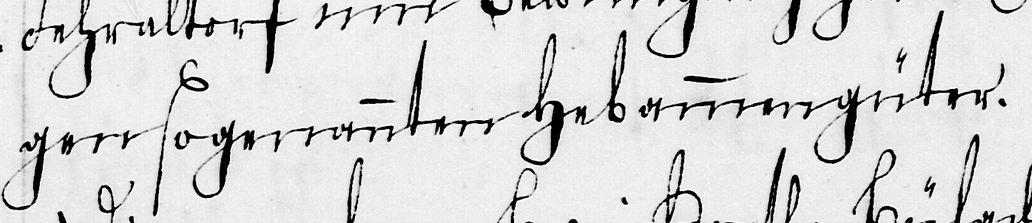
gen sogenannten Hebammengüter.
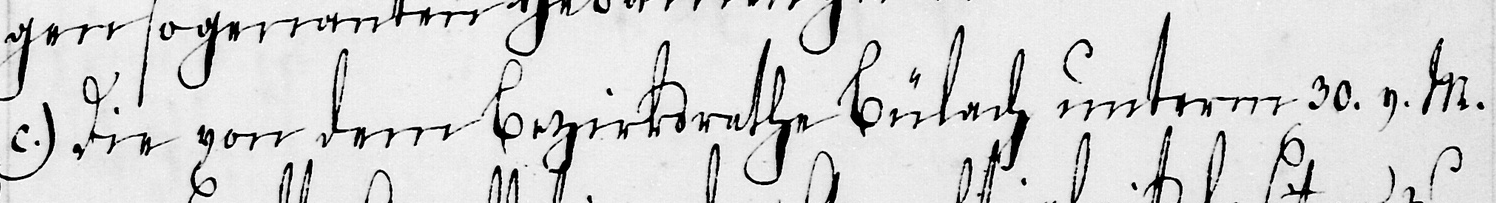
c.) Die von dem Bezirksrathe Bülach unterm 30. v. M.
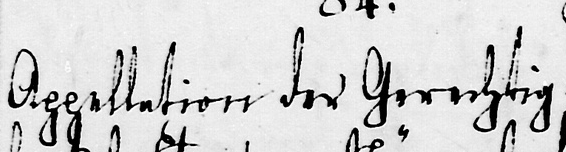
Appellation der Gerechtig¬
